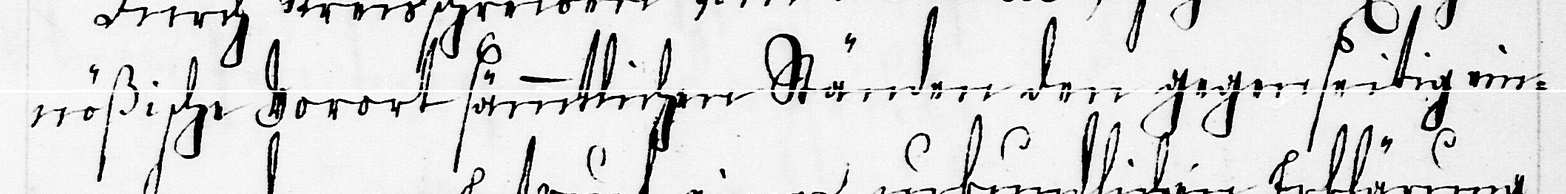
nößische Vorort sämmtlichen Ständen den gegenseitig ein¬
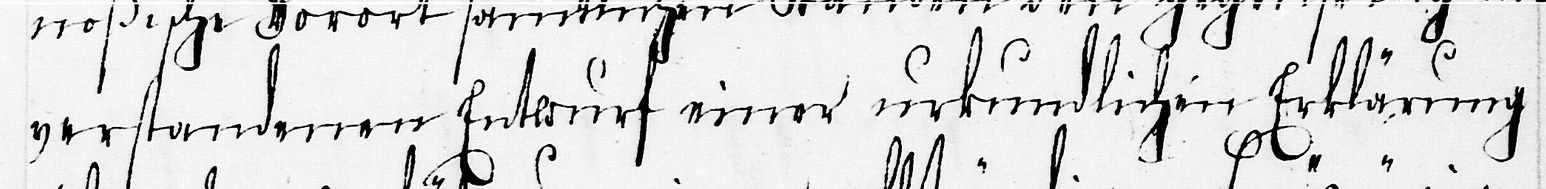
verstandenen Entwurf einer urkundlichen Erklärung
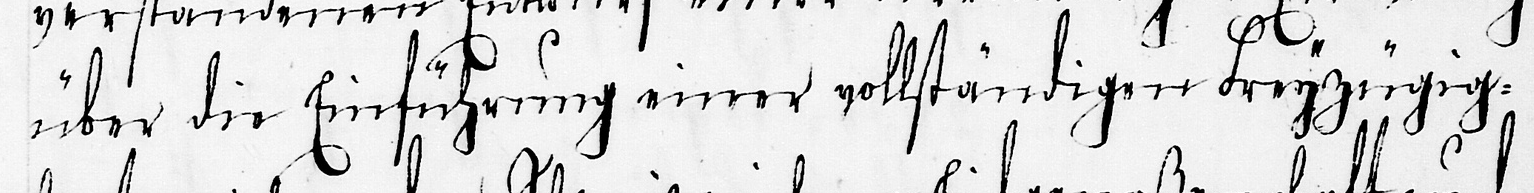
über die Einführung einer vollständigen Freyzügig¬
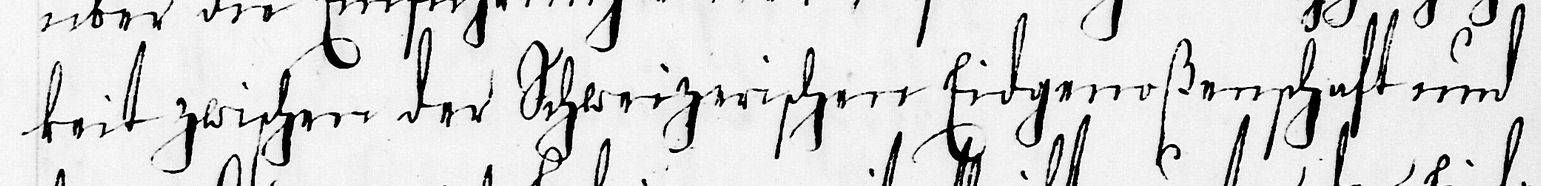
keit zwischen der Schweizerischen Eidgenoßenschaft und
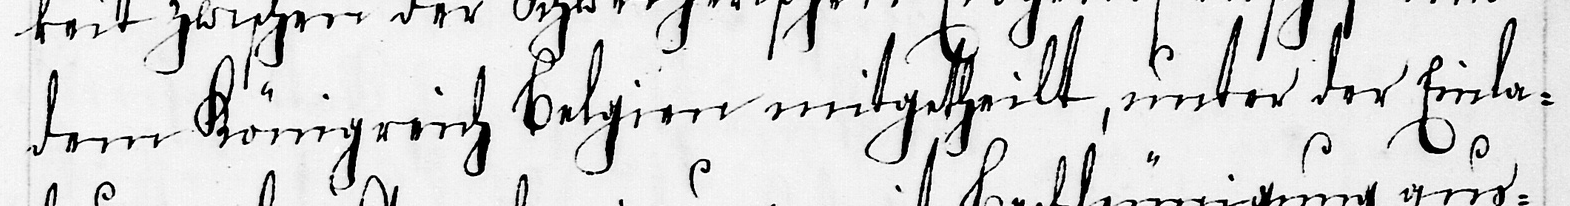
dem Königreich Belgien mitgetheilt, unter der Einla¬
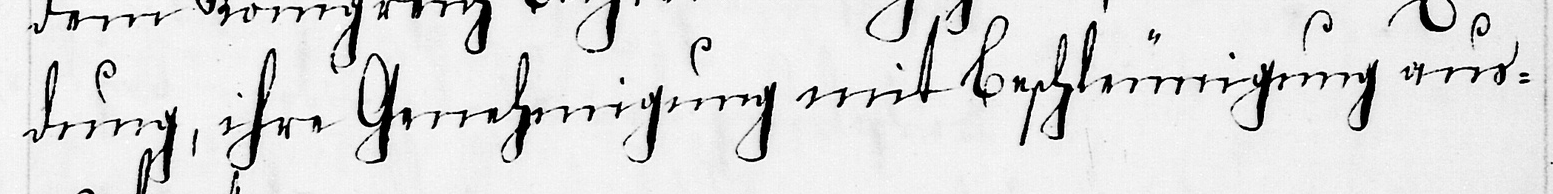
dung, ihre Genehmigung mit Beschleunigung aus¬
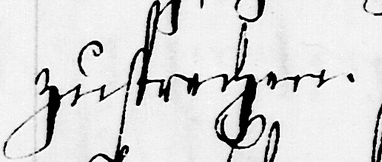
zusprechen.
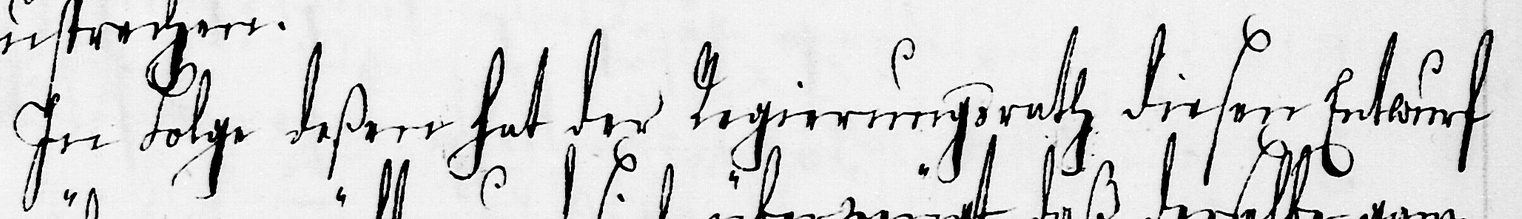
In Folge deßen hat der Regierungsrath diesen Entwurf
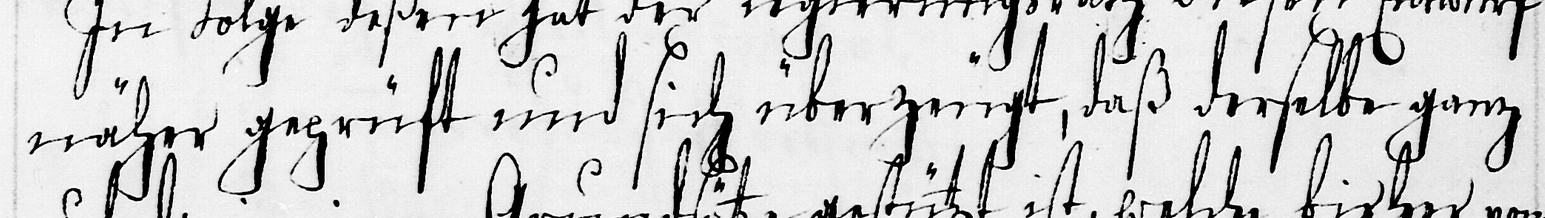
näher geprüft und sich überzeugt, daß derselbe ganz
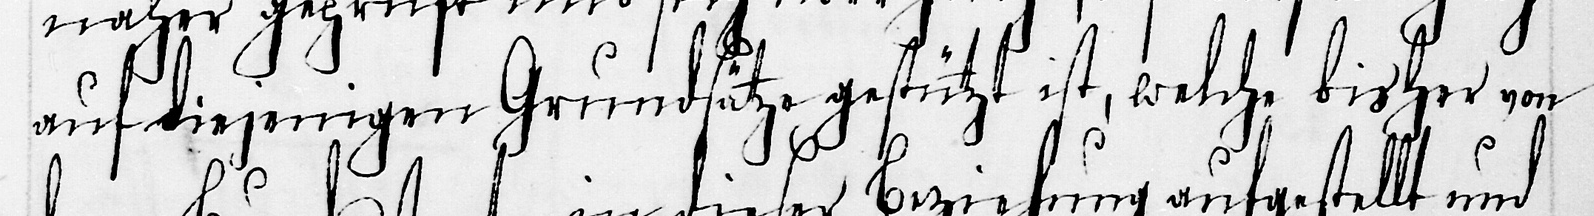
auf diejenigen Grundsätze gestützt ist, welche bisher von
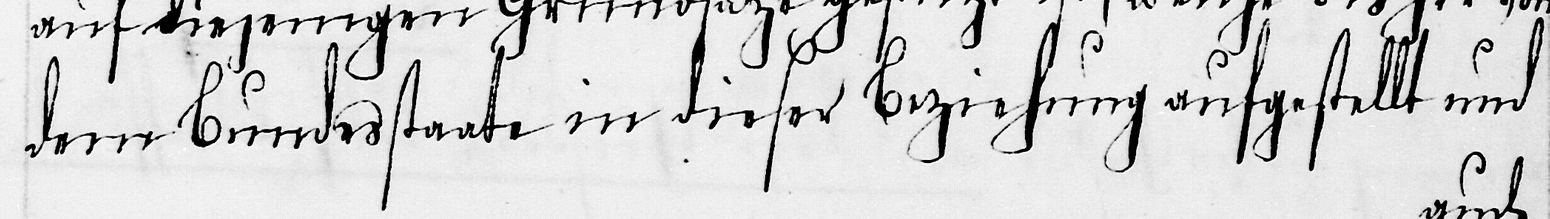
dem Bundesstaate in dieser Beziehung aufgestellt und
